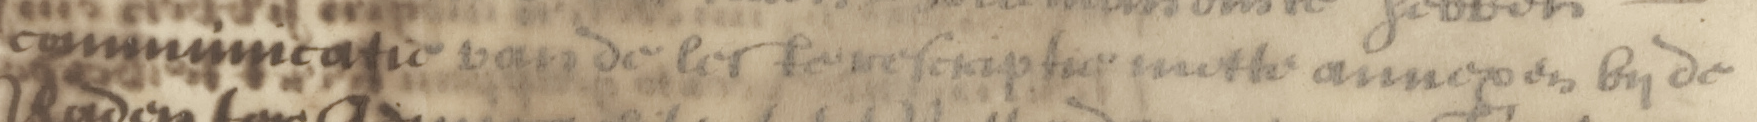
communicatie van de leste rescriptie mette annexen by de
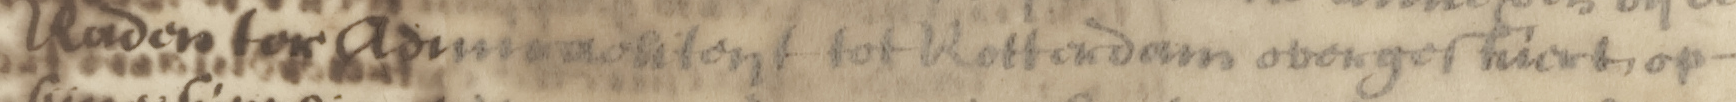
Raden ter Admiraliteyt tot Rotterdam overgestuert, op
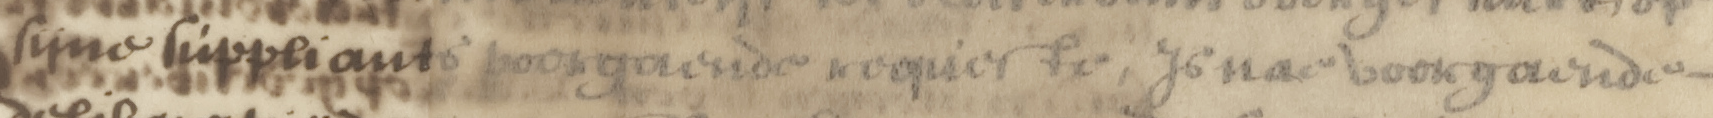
sijne suppliants voorgaende requeste. Is na voorgaende
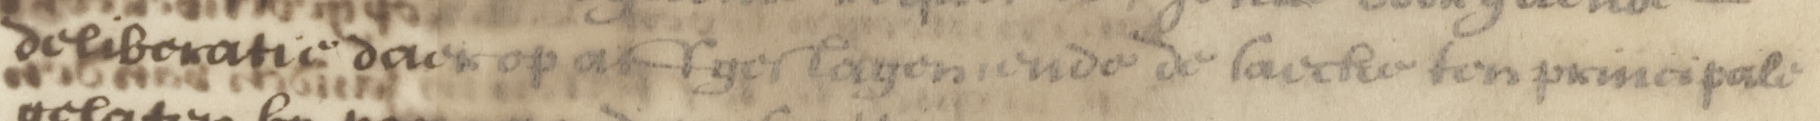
deliberatie daer op affgeslagen, ende de saecke ten principale
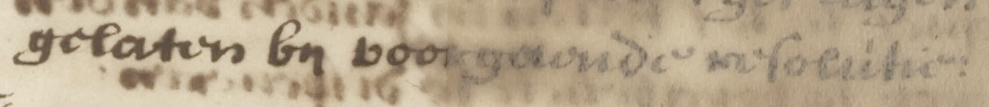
gelaten by voorgaende resolutie.
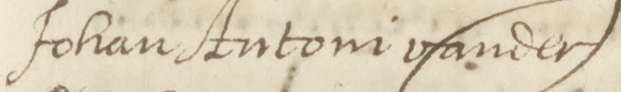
Johan Antoni vander
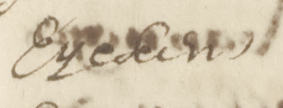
Eycken,
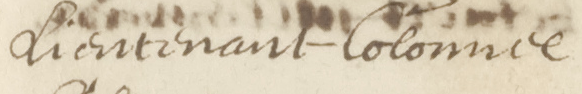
Lieutenant Colonnel
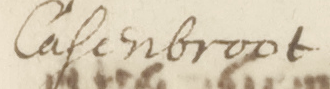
Casenbroot.
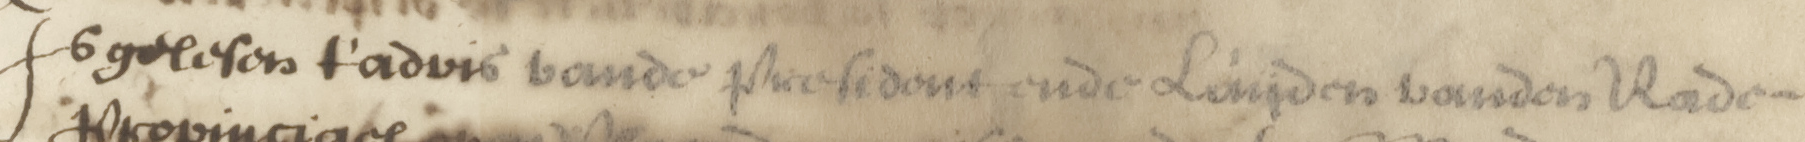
Is gelesen t'advis vande President ende Luijden vanden Rade-
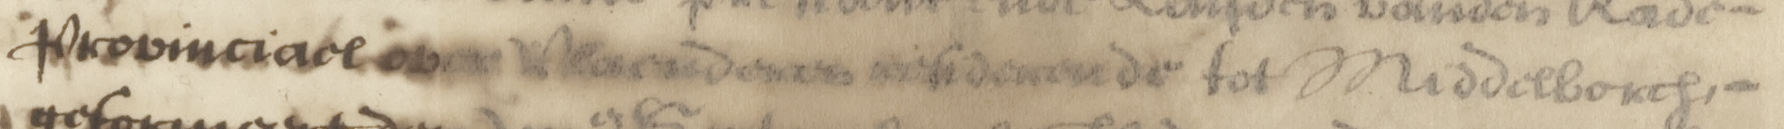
Provinciael over Vlaenderen residerende tot Middelborch, -
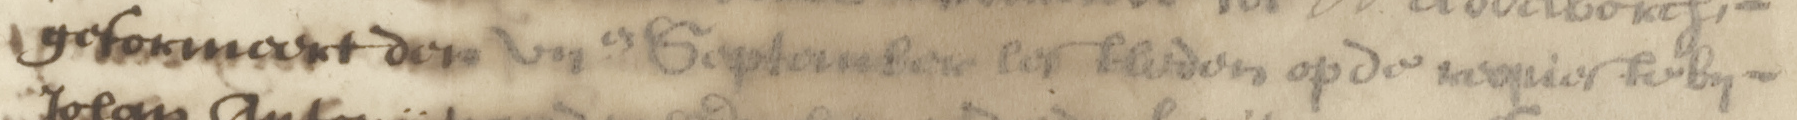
geformeert den vijen September lestleden opde requeste by-
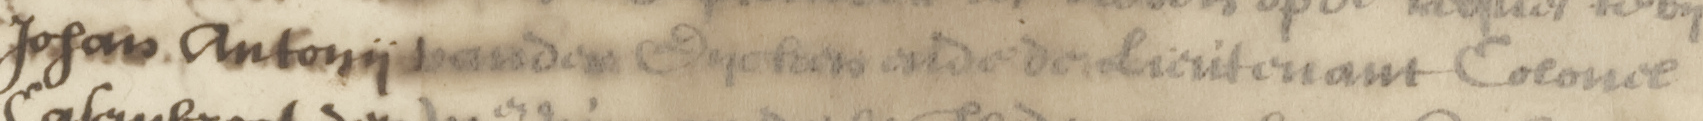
Johan Antonij van der Eycken ende de lieutenant Colonel
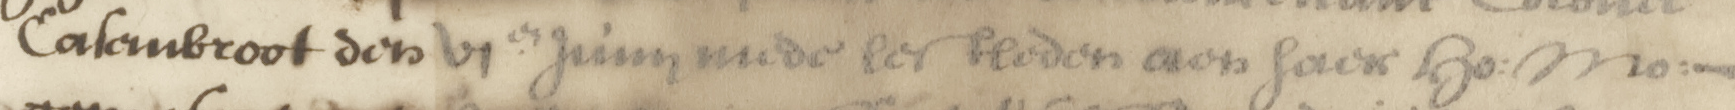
Casembroot den vjen Juny mede lestleden aen haer Ho:Mo:-
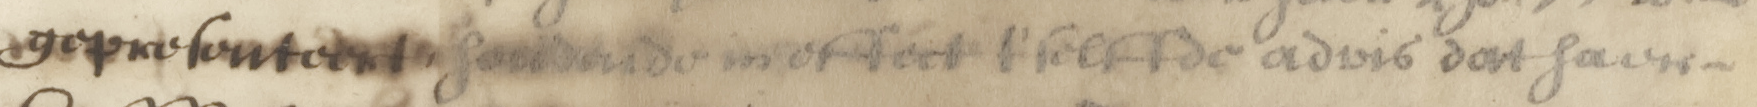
gepresenteert, houdende in effect t'selffde advis dat haer-
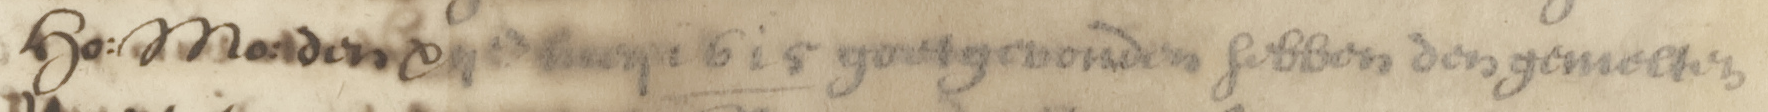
Ho:Mo: den xijen mey 1615 goetgevonden hebben den gemelten
